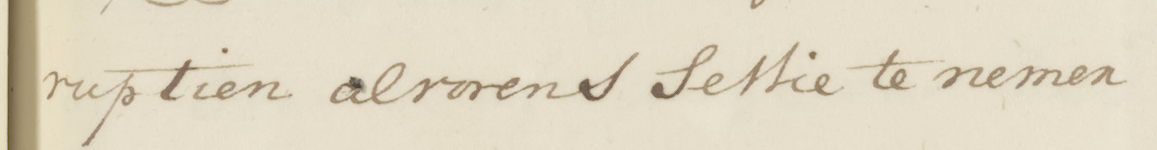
ruptien alvorens sessie te nemen
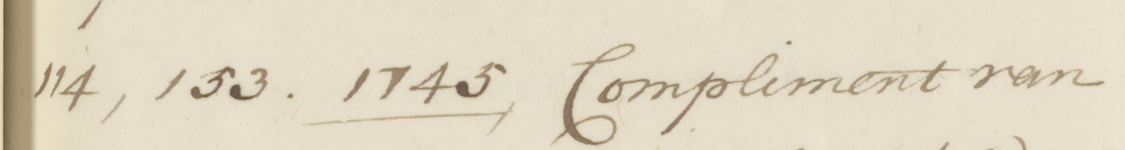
114, 153. 1745, Compliment van
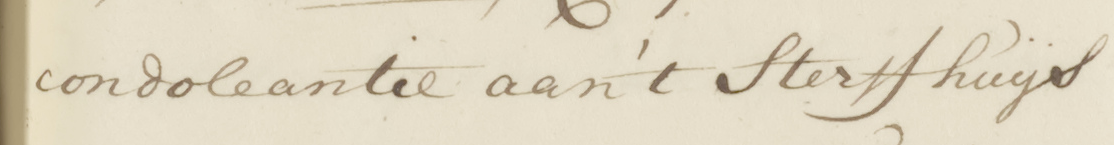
condoleantie aan‛t sterffhuijs
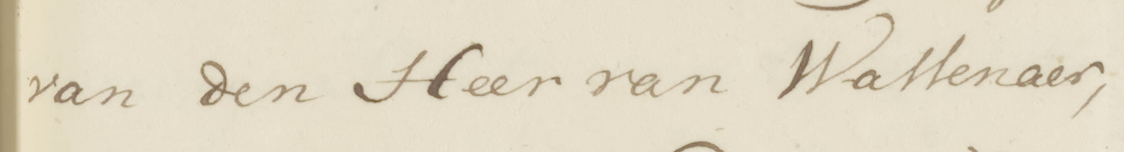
van den Heer van Wassenaer,
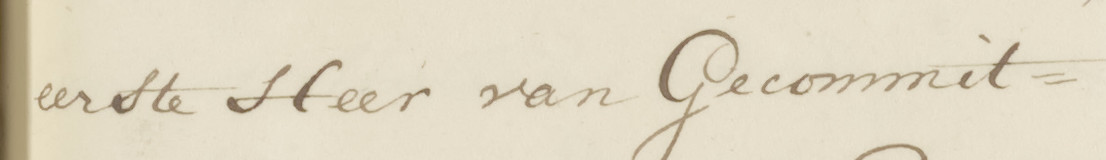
eerste Heer van Gecommit=
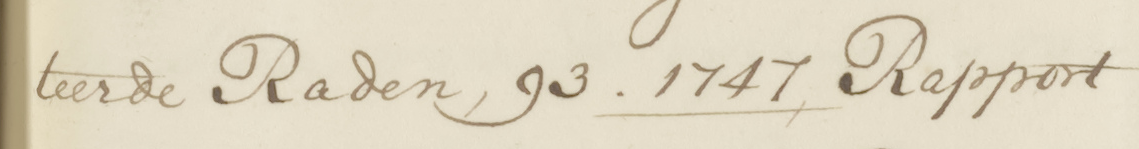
teerde Raden, 93. 1747 , Rapport
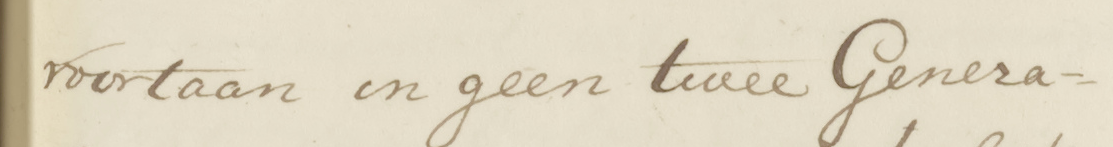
voortaan in geen twee Genera=
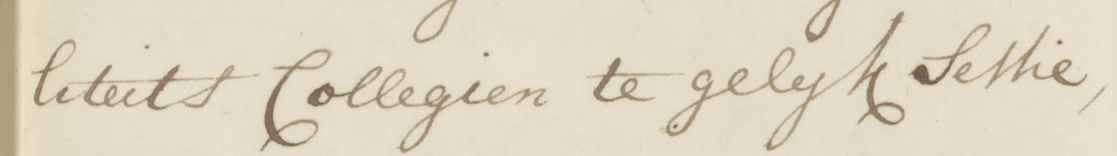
liteits Collegien te gelyk sessie,
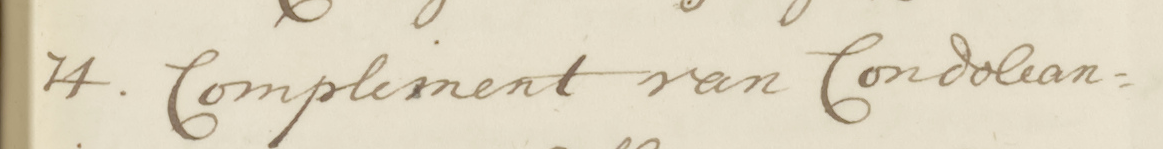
74. Compliment van Condolean=
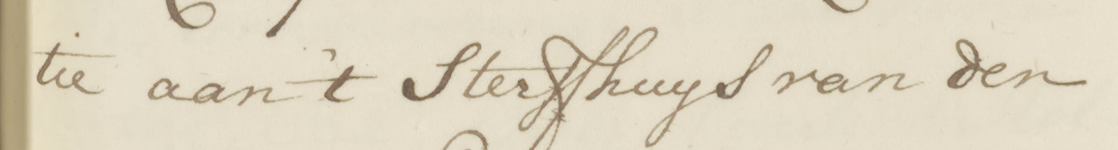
tie aan 't sterffhuys van den
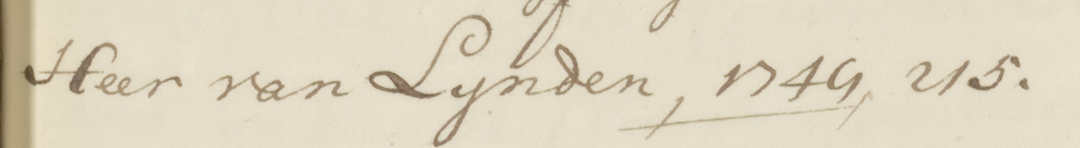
Heer van Lynden, 1748, 215.
